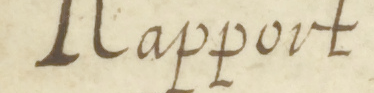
Rapport
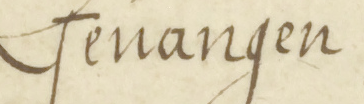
Geuangen
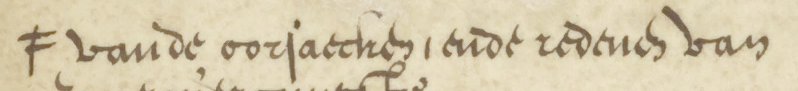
Ŧ vande oorsaecken, ende redenen van
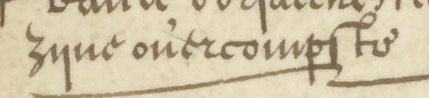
zyne ouercompste
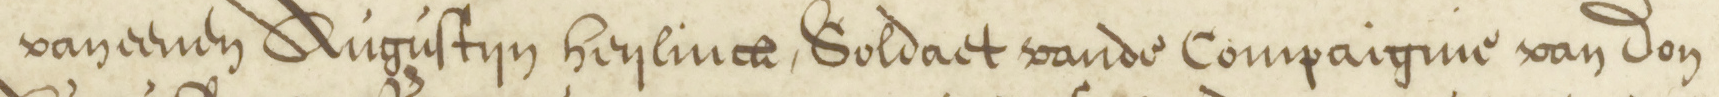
van eenen Augustyn heylinck, Soldaet vande Compaignie van Don
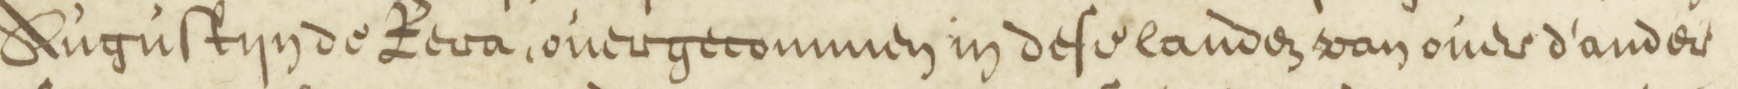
Augustyn de Rera, ouergecommen in dese landen van ouer d‛ander
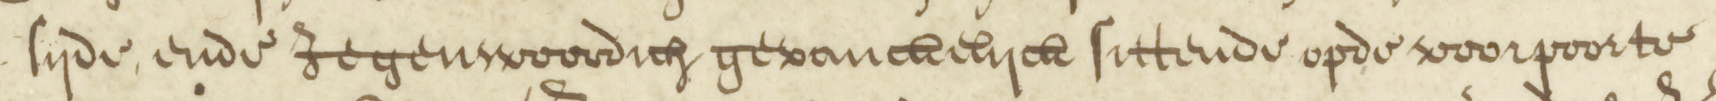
syde, ende Jegenwoordich gevanckelyck sittende opde voorpoorte
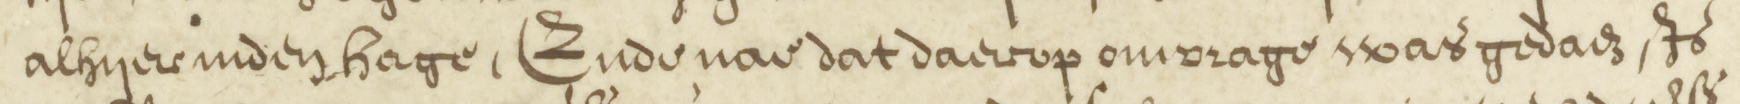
alhyer inden hage. Ende nae dat daerop omvrage was gedaen, Is
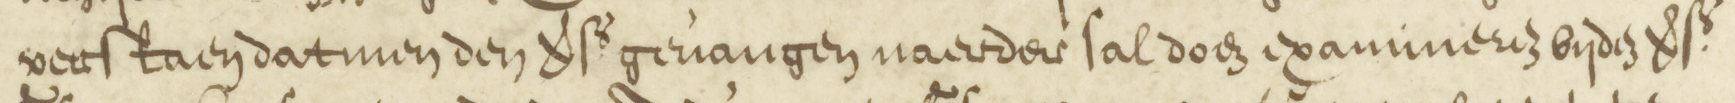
verstaen datmen den vs geuangen naerder sal doen examineren byden vs.
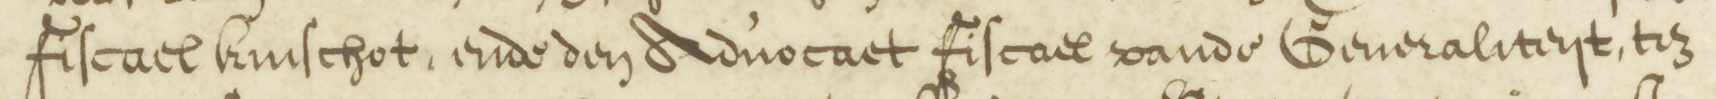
Fiscael kinschot, ende den Aduocaet Fiscael vande Generaliteyt, ten
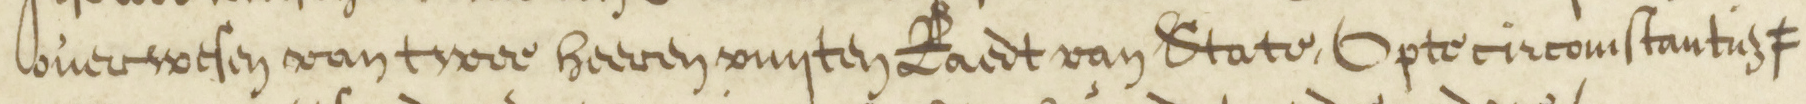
ouerwesen van twee heeren vuyten Raedt van State, Opte circomstantien Ŧ
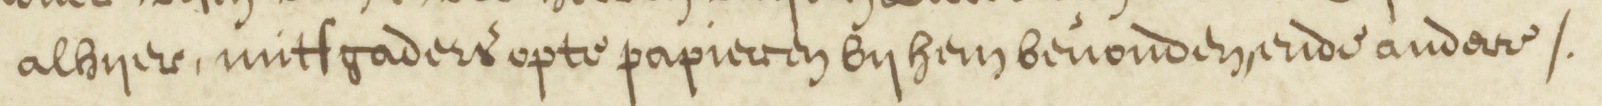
alhyer, mitsgaders opte papieren by hem beuonden, ende andere.
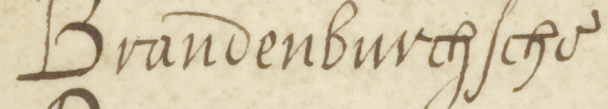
Brandenburchsche
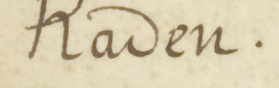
Raden.
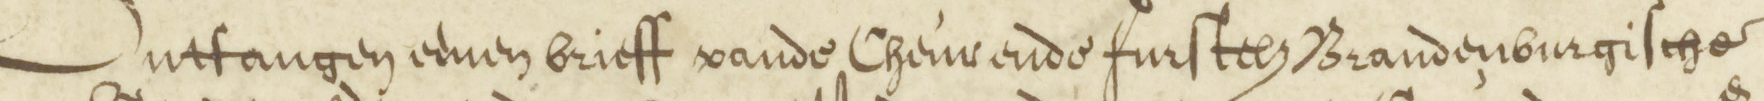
Ontfangen eenen brieff vande Cheur ende Furstel Brandenburgische
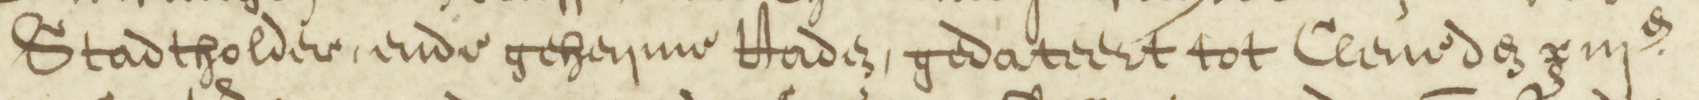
Stadholder, ende geheyme Raden, gedateert tot Cleue den xiijen.
